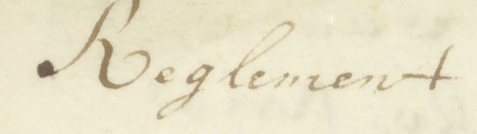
Reglement
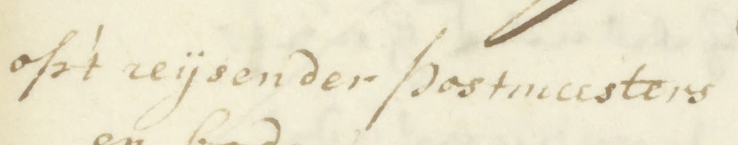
op't reijsen der Postmeesters
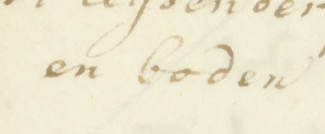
en boden
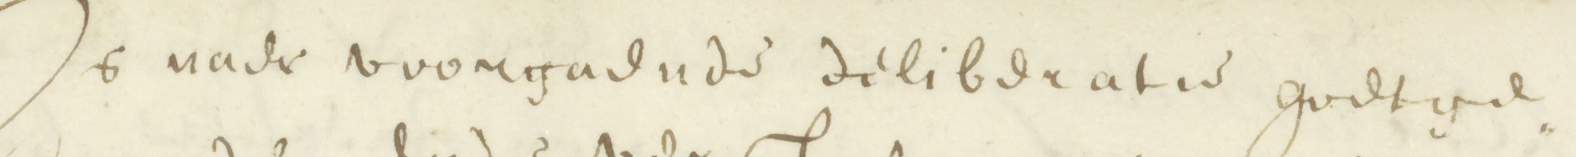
Is naer voorgaende deliberatie goetge„
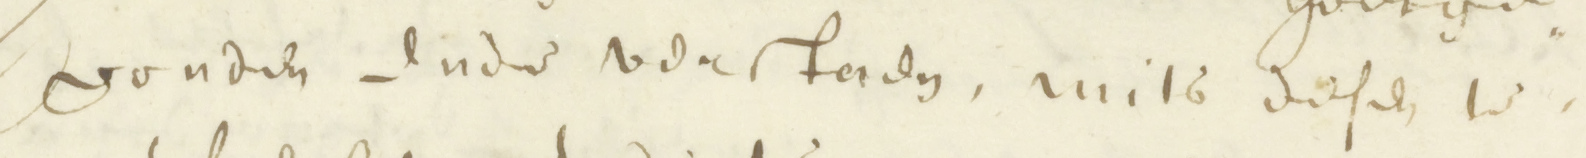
vonden ende verstaen, mits desen te
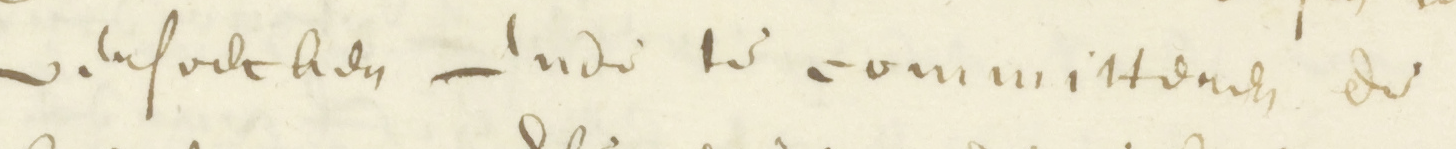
versoecken ende te committeren de
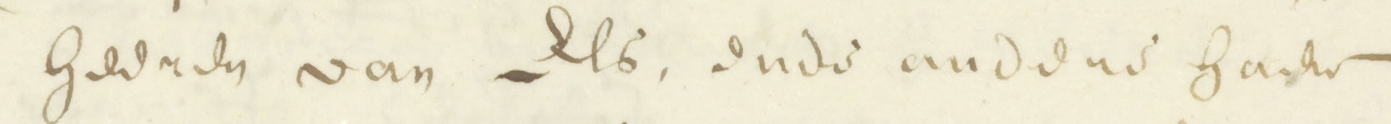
heeren van Els, ende andere haer
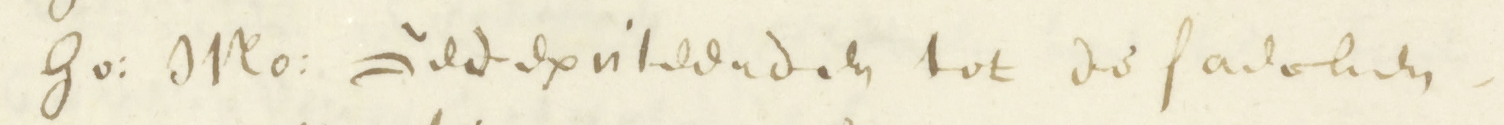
ho:Mo: Gedeputeerden tot de saecken
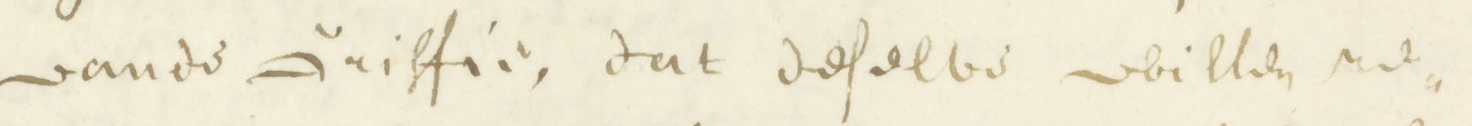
vande Griffie, dat deselve willen re,,
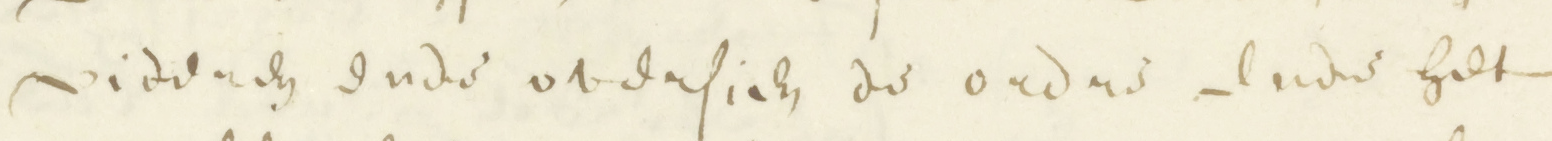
videren ende oversien de ordre ende het
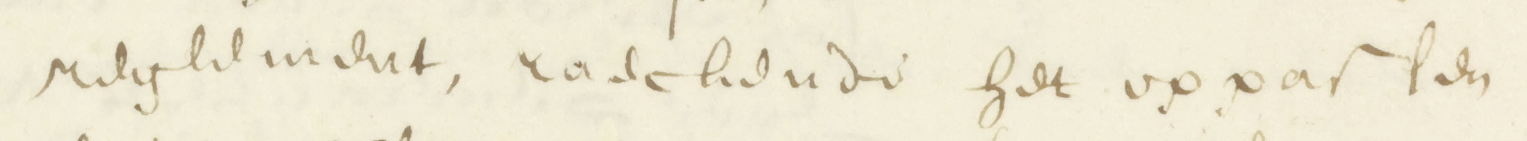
reglement, raeckende het oppassen
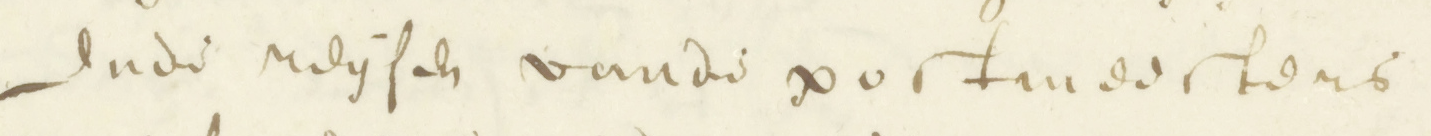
ende reijsen vande postmeesters
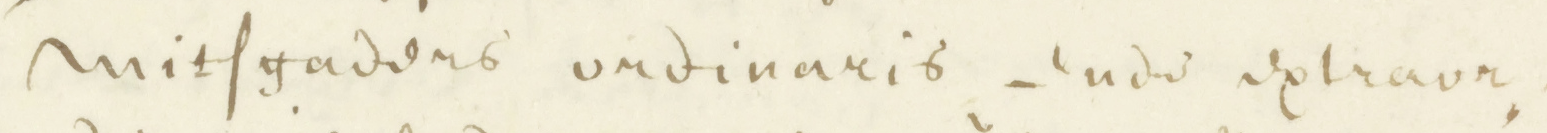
mitsgaders ordinaris ende extraor„
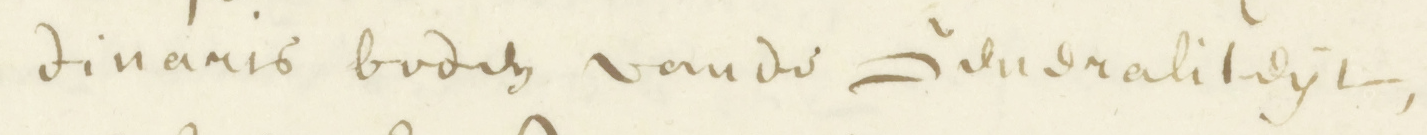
dinaris boden vande Generaliteijt,
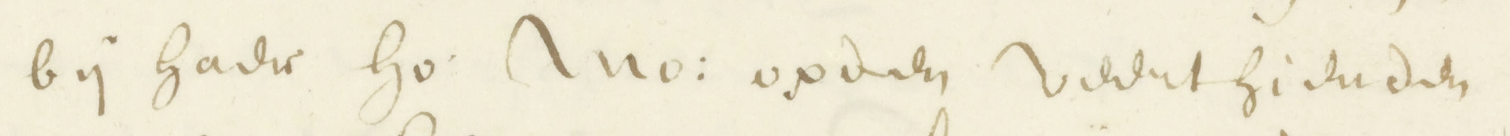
bij haer ho:Mo: opden veerthienden
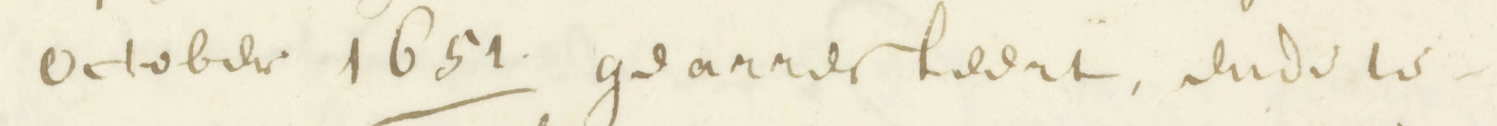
october 1651. gearresteert, ende te
